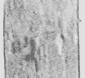七十
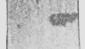一
